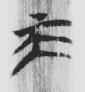天
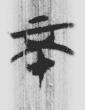不
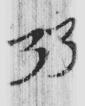{乃乃}
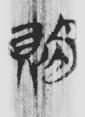賜
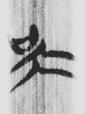吳
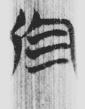於
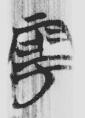𩁹
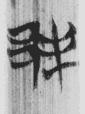邦
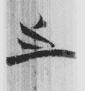之
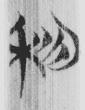利
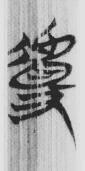虘B
